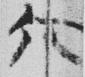六
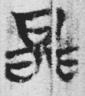晶（三）
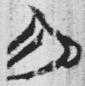勿
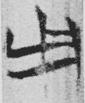用
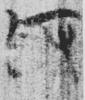取
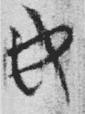女
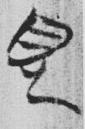見
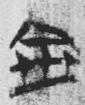金
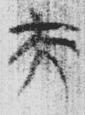夫
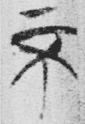不
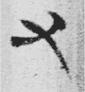又（有）
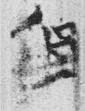躳（躬）
